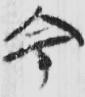○（主）
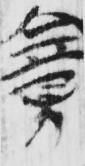賽
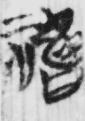禱
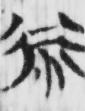{行示}（行）
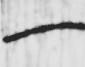一
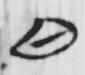白
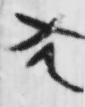犬
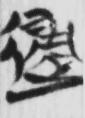歸
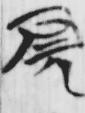○（冠）
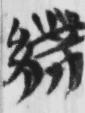○（帶）
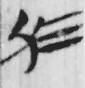於
